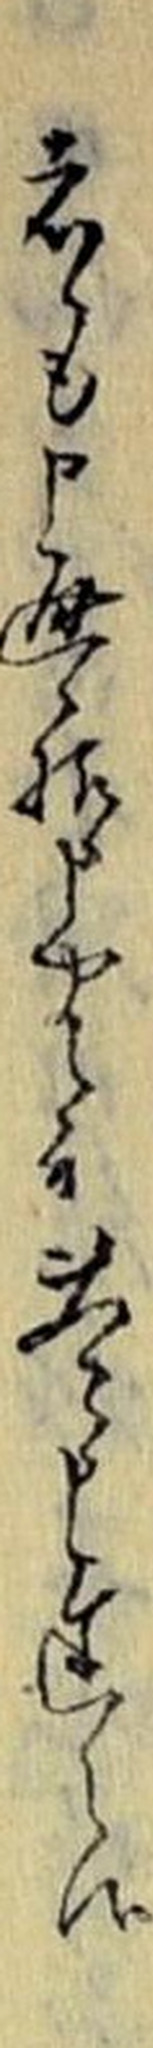者へも申通候様申聞候に付夫々申達之候
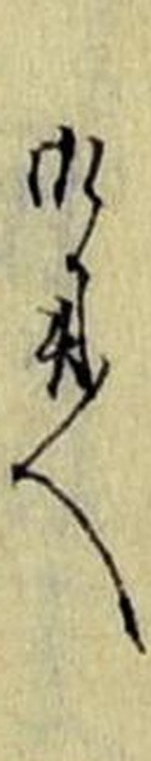御用人
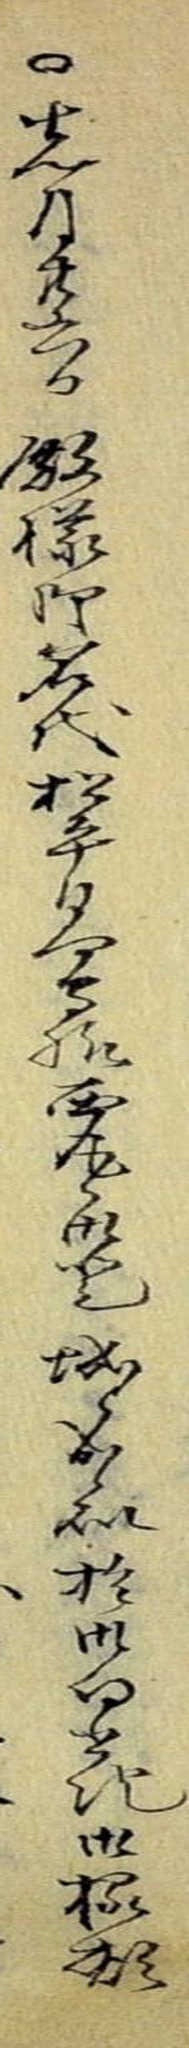○先月廿六日殿様御名代松平日向守様西丸へ御登城被成候処於御白書院御縁頬
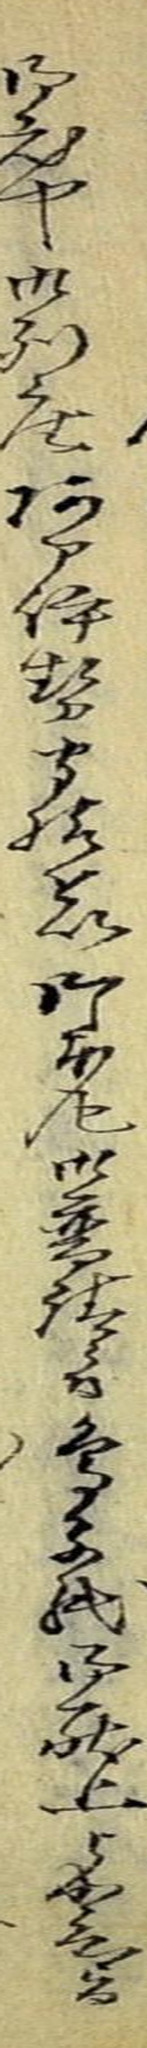御家老御列座阿部伊勢守様を以御本丸御普請に付鳥子紙御献上被成度旨
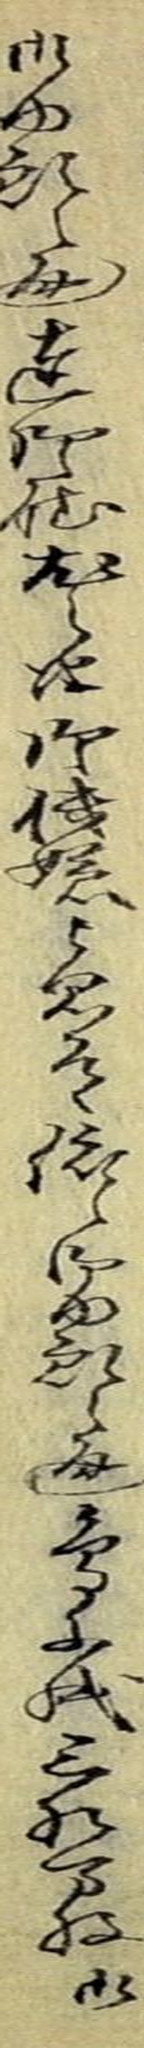御内願之通達御聴尤之儀御機嫌被思召候依之御内願之通鳥子紙三拾万米枚御
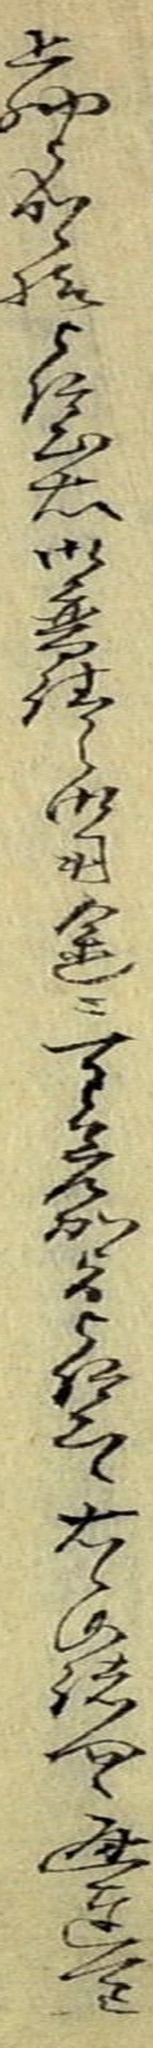上納被成候様被仰出右御普請之御用途に可被差加旨被仰出候右之趣諸向へ通達可被
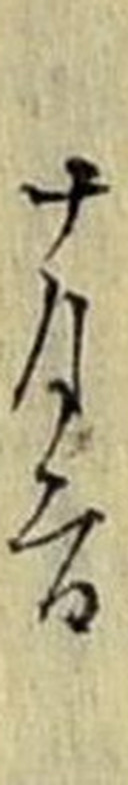十月二日
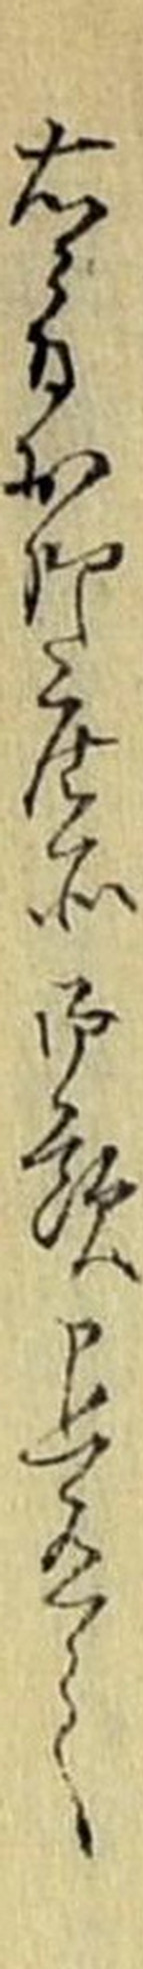右に付於御座所御歓申上有之
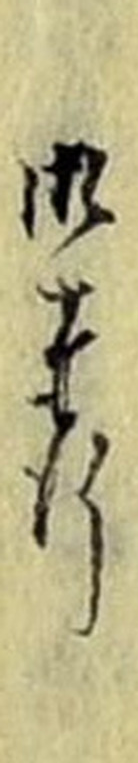御奉行
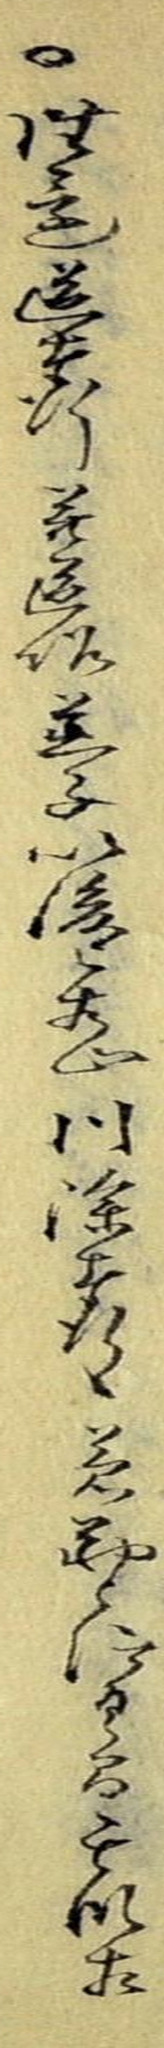○往還道奉行并道作荒子以後被相止川除奉行へ兼勤被仰付候間其段相

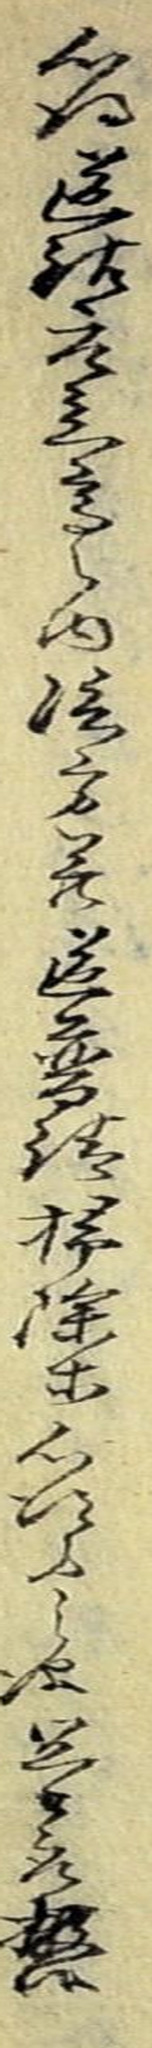心得道銀取立高之内渡方并道普請掃除等心得方之儀宜被取扱候
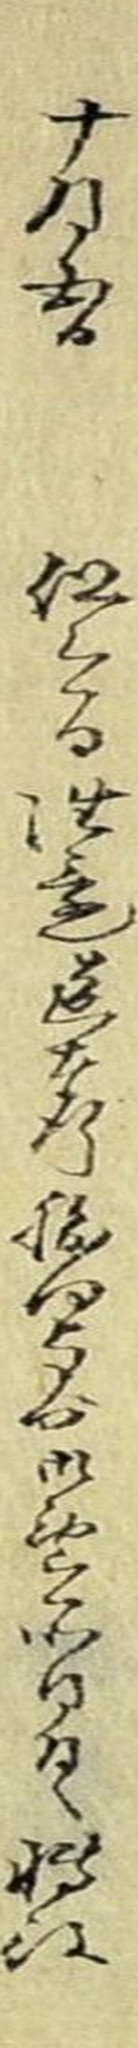十月五日但今日往還道奉行勝田与右衛門御台所目付へ転役
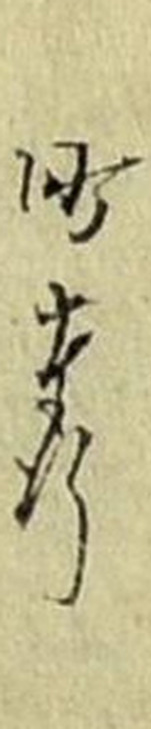御奉行
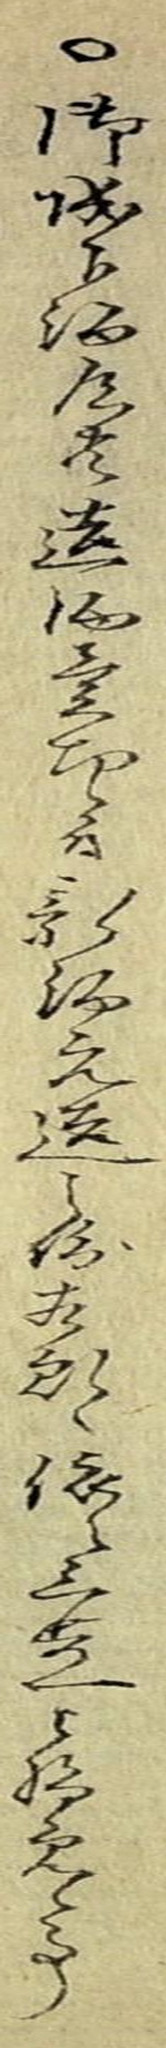○御城下酒屋共造酒売切候に付新酒元造之儀相願候依之三歩一被指免候事
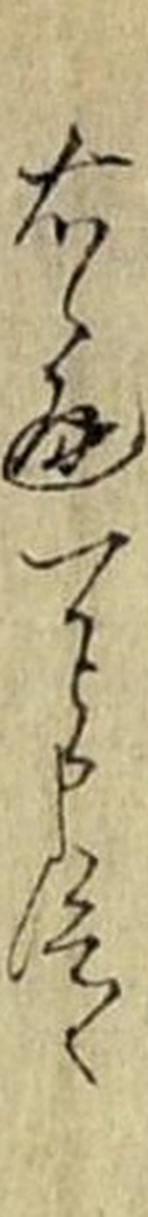右之通可被申渡候
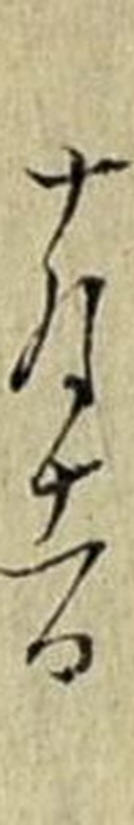十月十一日
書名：命令之部 六
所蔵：福井県文書館 Fukui Prefectural Archives
